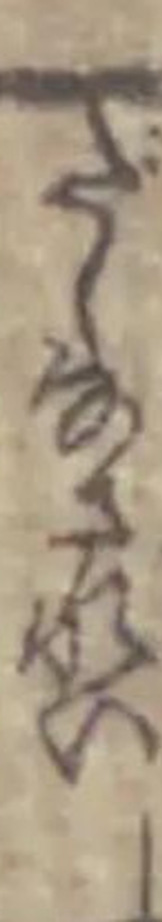だしなされい
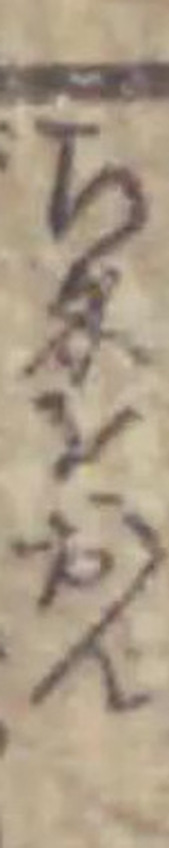ちえをおん
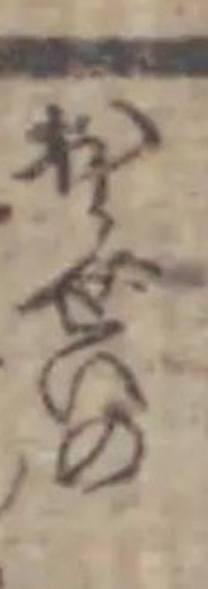おうぜいの
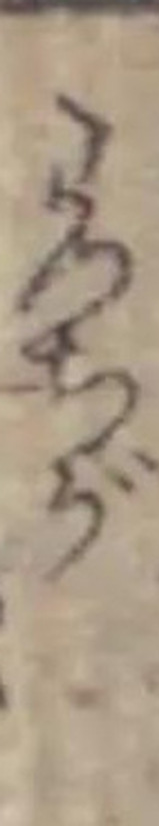わつちが
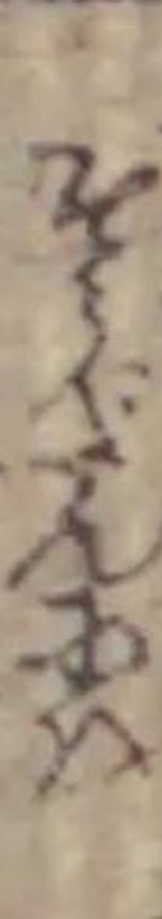そうだんには
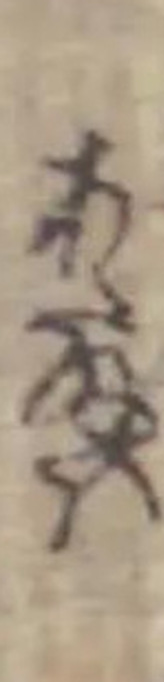あたまは
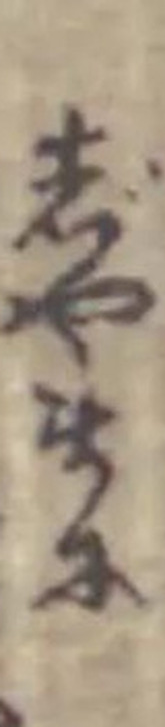じやまに
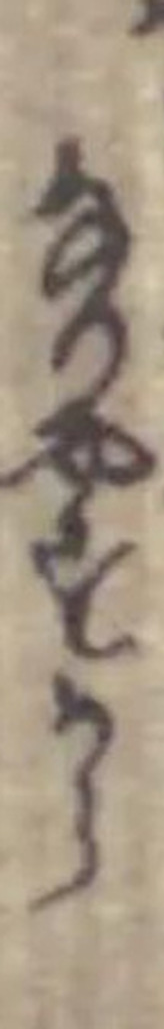なりやすから
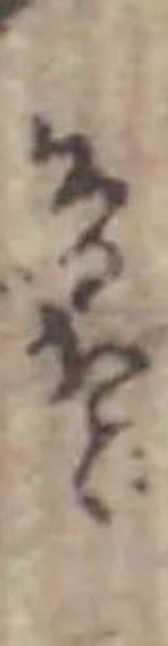なるほど
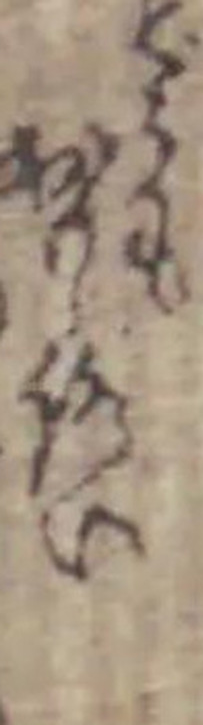おもしろい
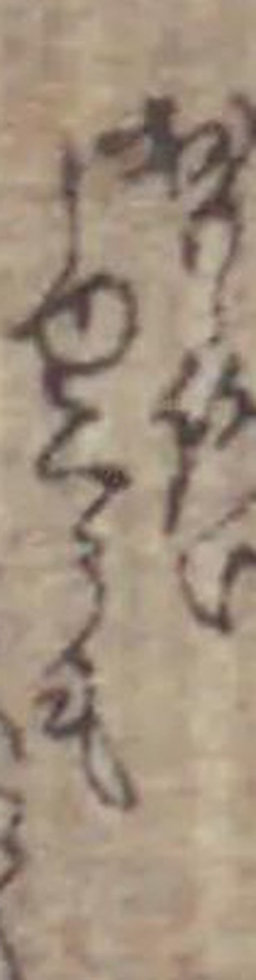しゆこうも
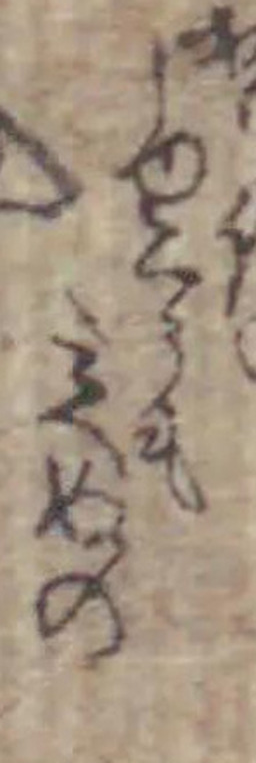みへぬの
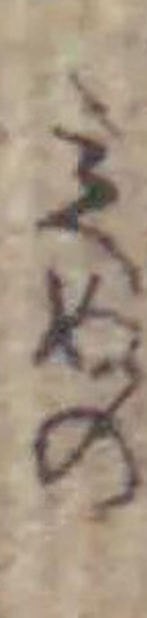みへぬの

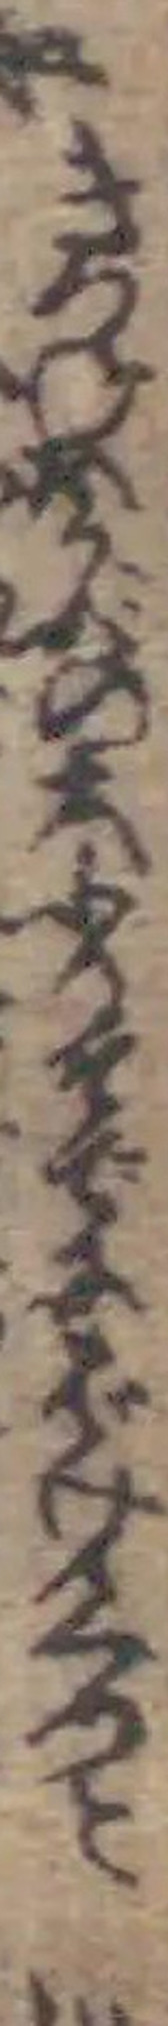きつねはかぶの大ふりそでにばけくつと
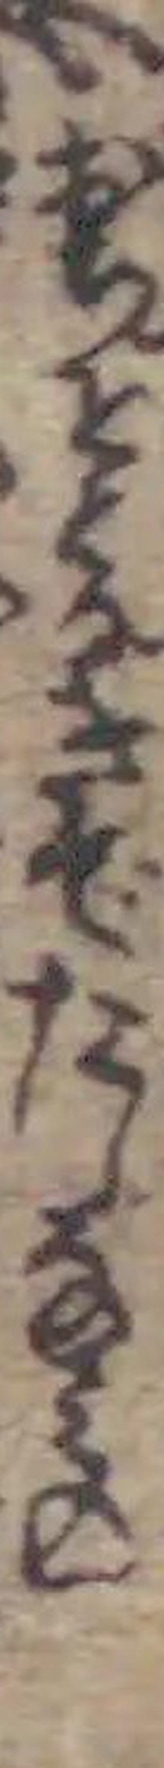おちをとるきでたしなみの
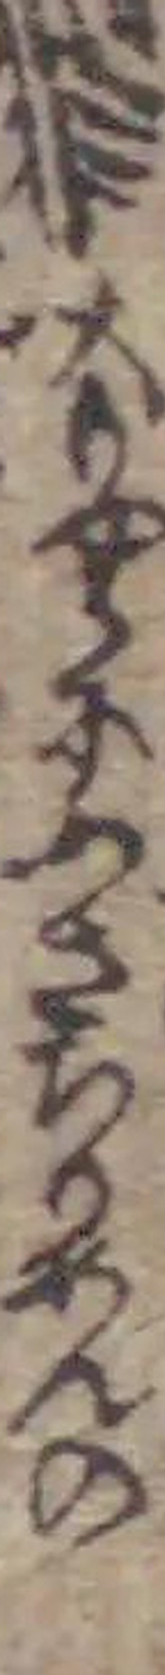大もやうにふさちりめんの
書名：化物昼寝鼾 2巻
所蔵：国立国会図書館 National Diet Library, JAPAN
